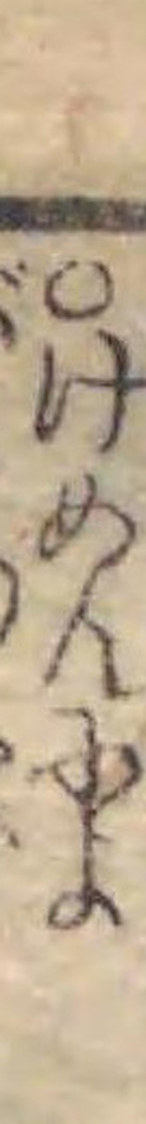○げめんによ
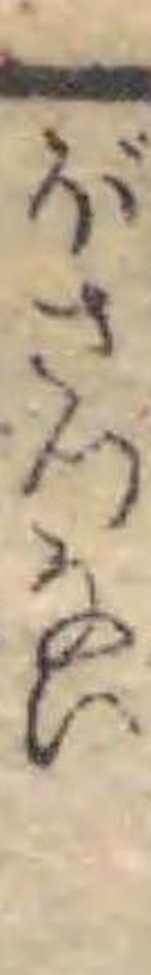ぼさつない
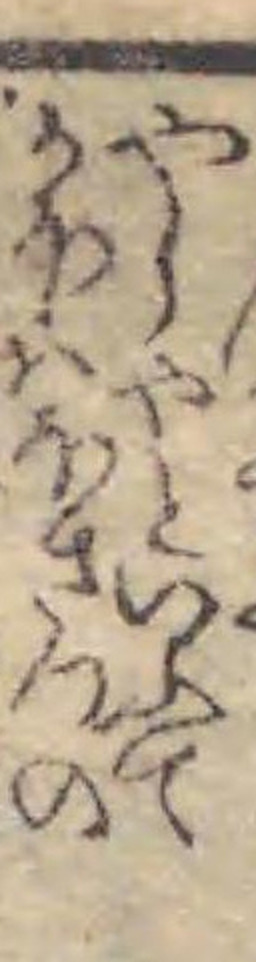かほはほさつの
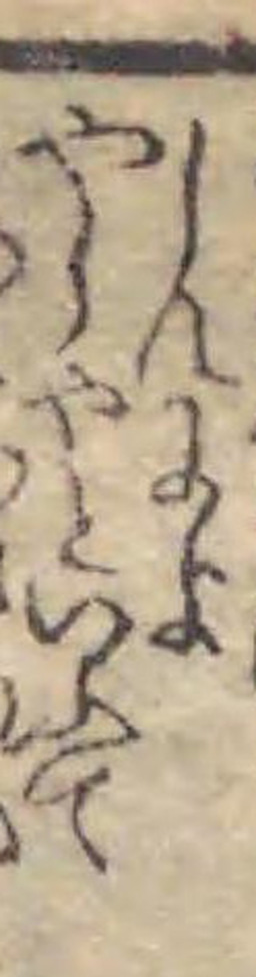やしやといふて
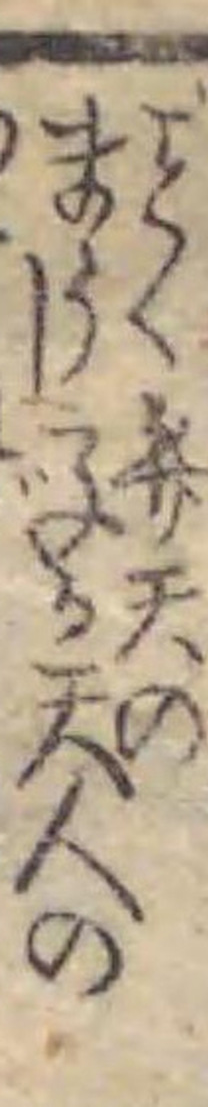まうし子が天人の
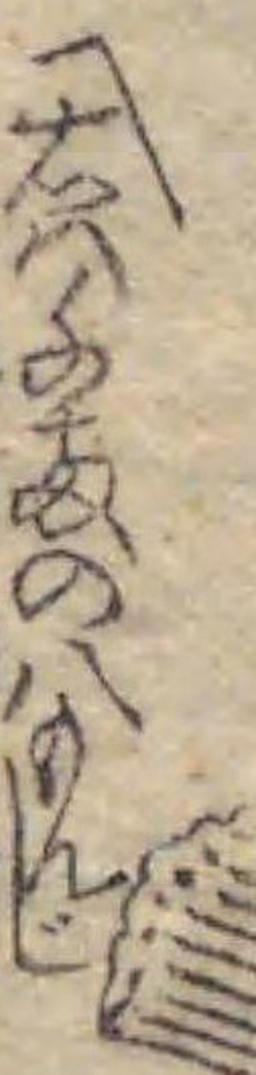〽右は千両の八もんじ
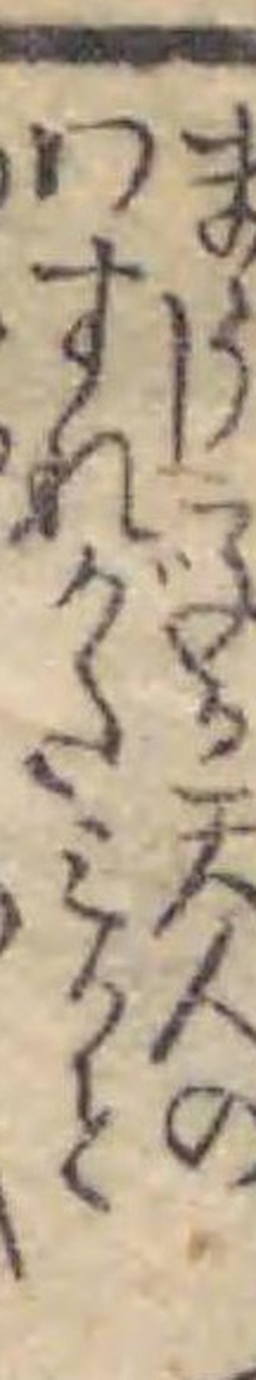わすれがたみかと
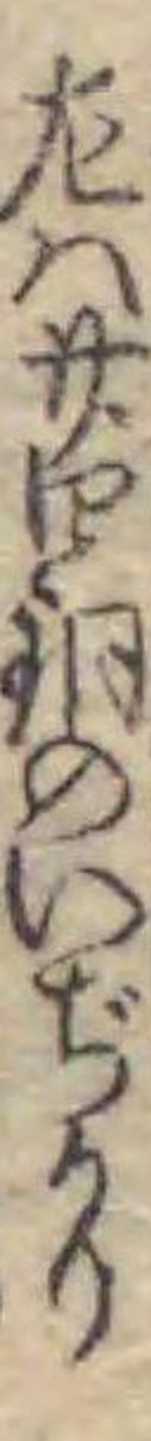左は廿四銅のいぢかり
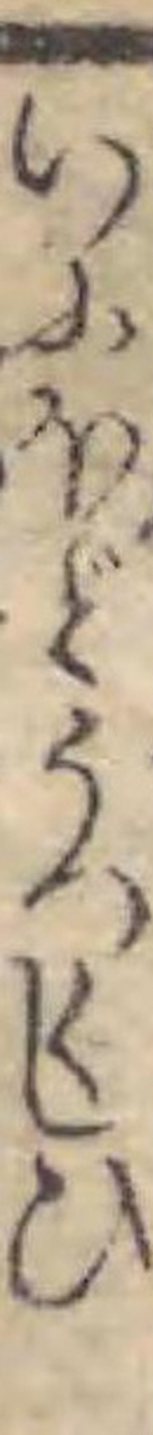いふほどうつくしひ
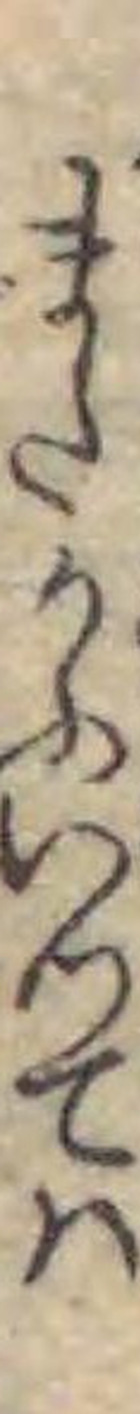またかふいつては
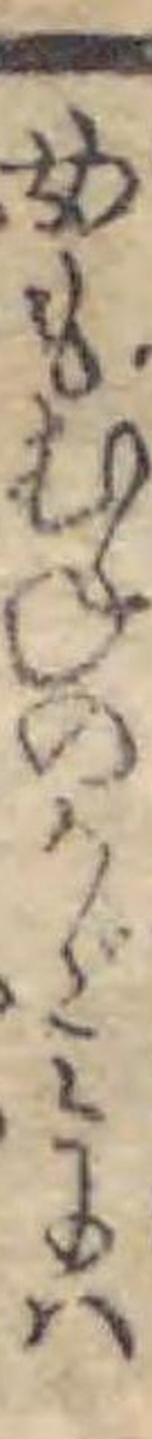女もむねのかゞみには
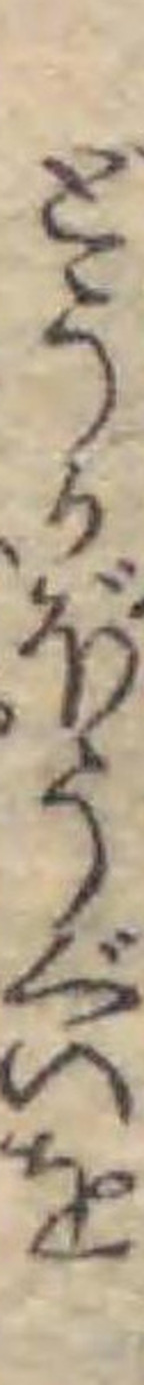どうかぼうぐいを
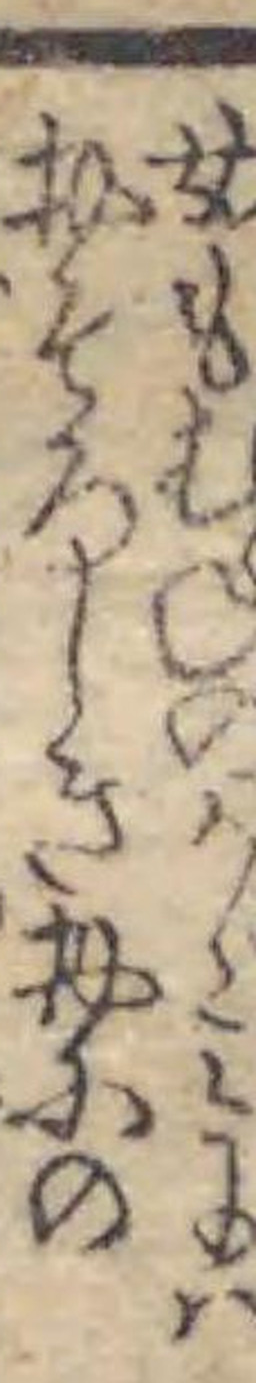おそろしきおにの
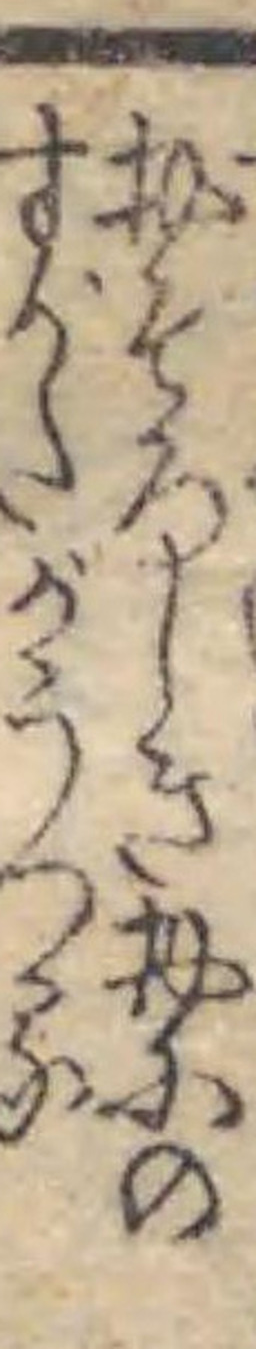すがたがうつる
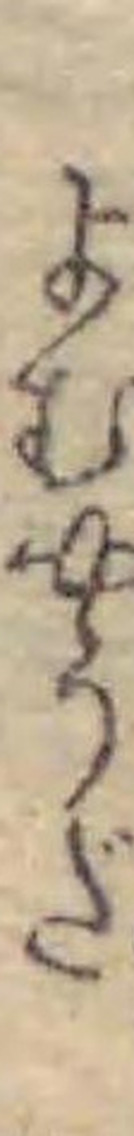よむやうだ
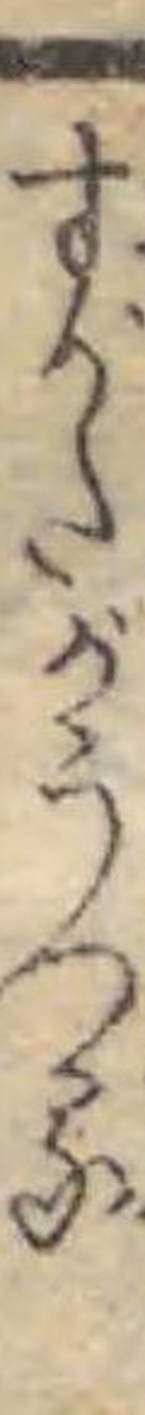すがたがうつる
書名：人心鏡写絵 : 3巻
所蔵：国立国会図書館 National Diet Library, JAPAN
